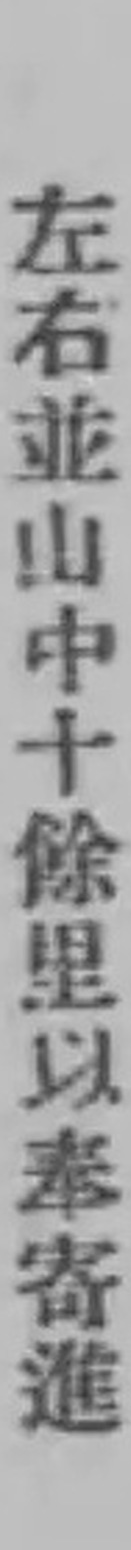左右並山中十余里以奉寄進
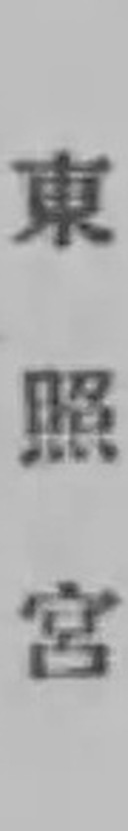東照宮
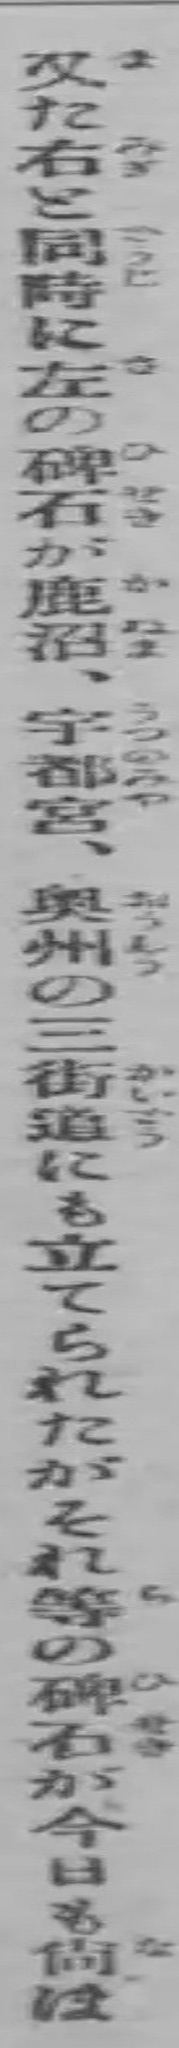又た右と同時に左の碑石が鹿沼、宇都宮、奥州の三街道にも立てられたがそれ等の碑石が今日も尚ほ
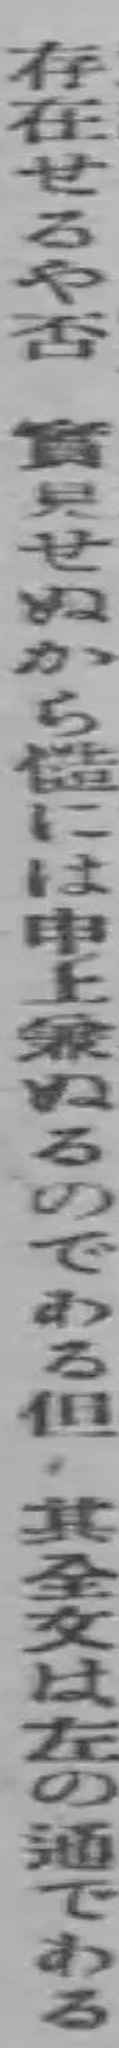存在せるや否実見せぬから慥には申上兼ぬるのである但し其全文は左の通である

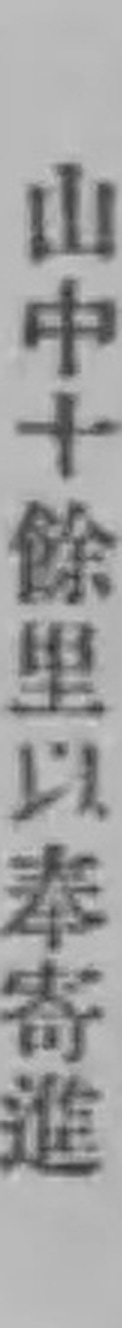山中十余里以奉寄進
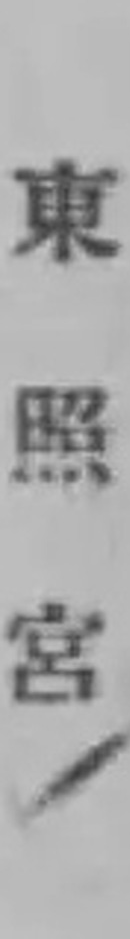東照宮
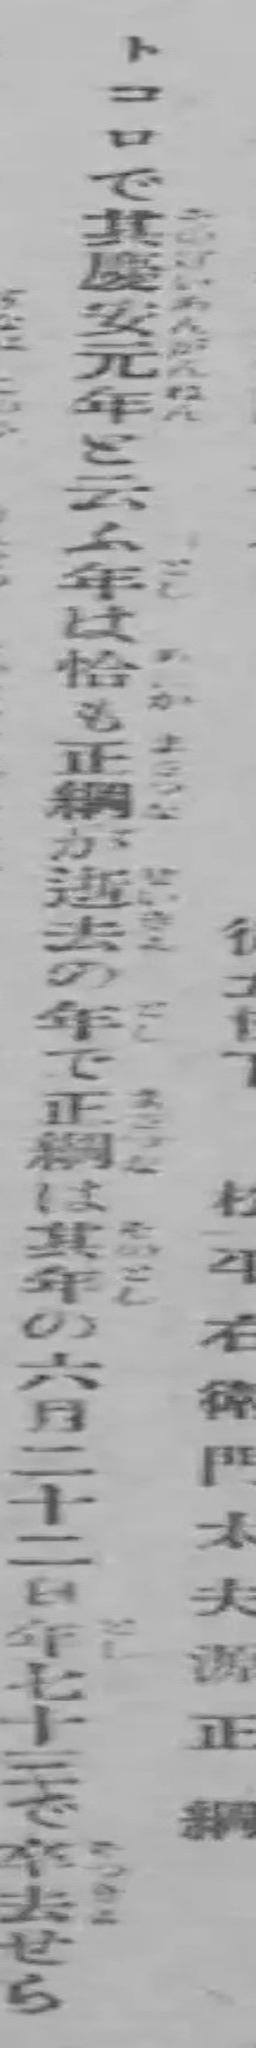トコロで其慶安元年と云ふ年は恰も正綱が逝去の年で正綱は其年の六月二十二日年七十三で卒去せら
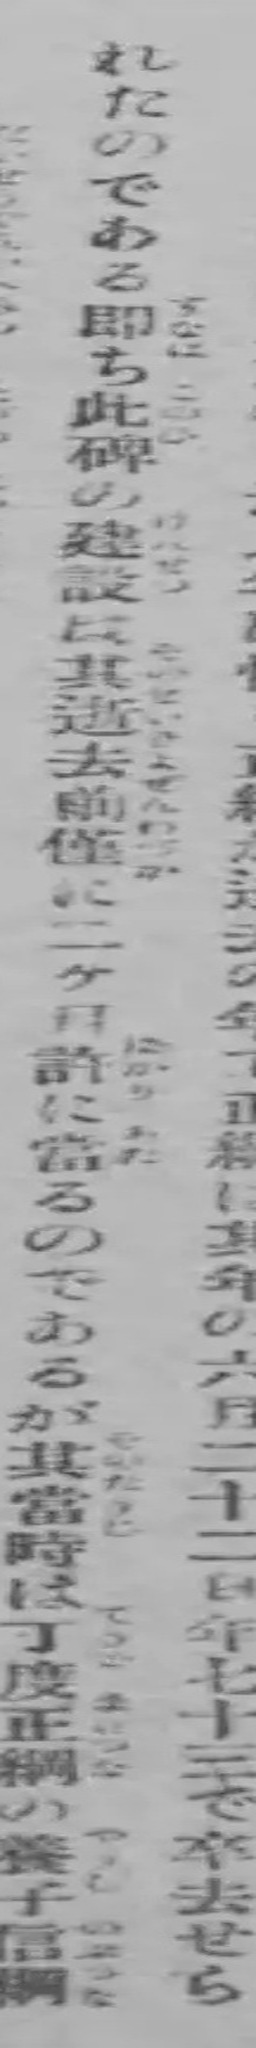れたのである即ち此碑の建設は其逝去前僅に二ヶ月許に当るのであるが其当時は丁度正綱の養子信綱
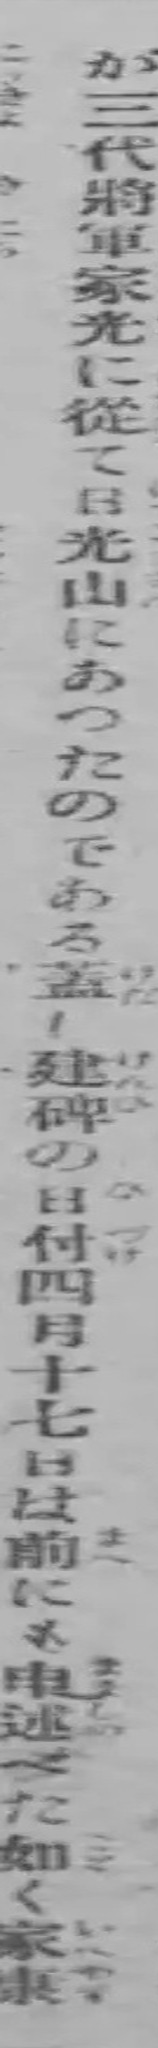が三代将軍家光に従て日光山にあつたのである蓋し建碑の日付四月十七日は前にも申述べた如く家康
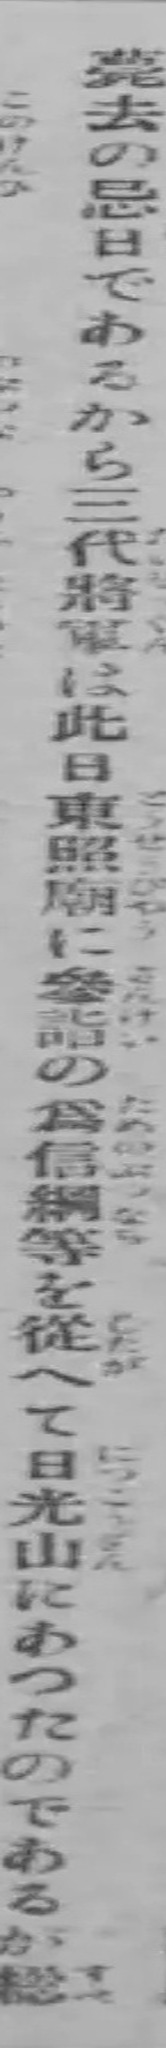薨去の忌日であるから三代将軍は此日東照廟に参詣の為信綱等を従へて日光山にあつたのであるが総
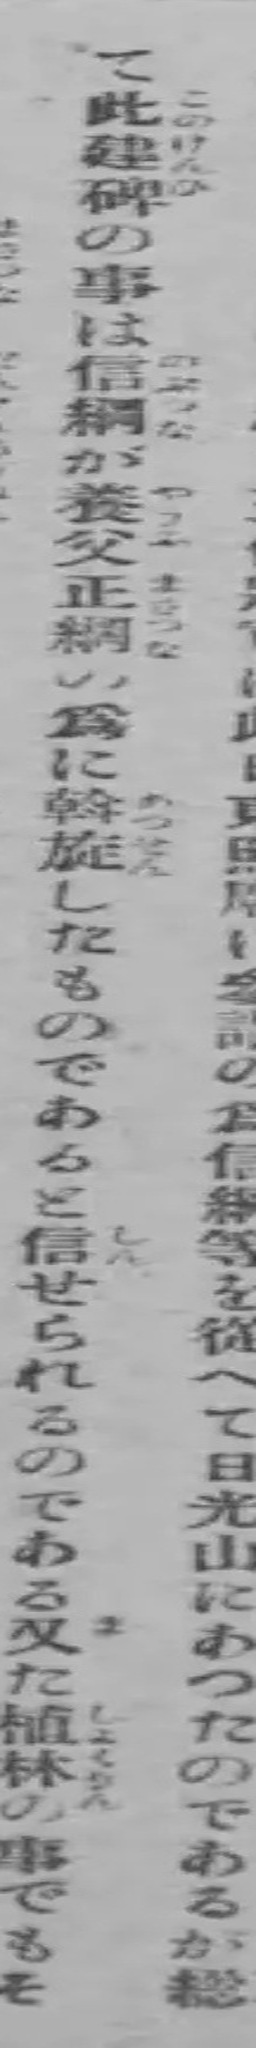て此建碑の事は信綱が養父正綱の為に斡旋したものであると信せられるのである又た植林の事でもそ
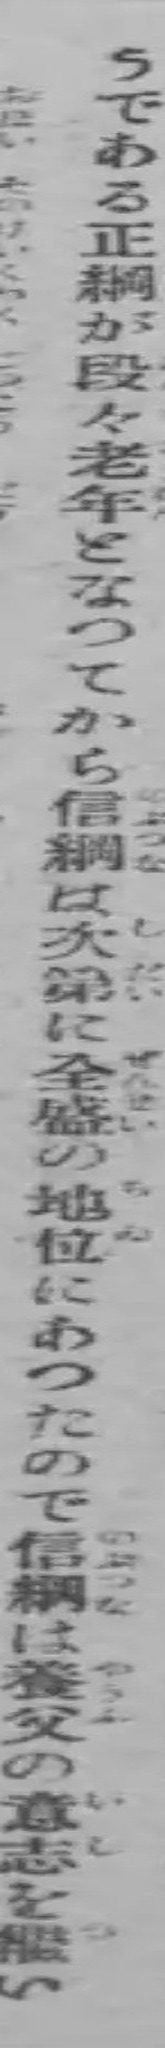うである正綱が段々老年となつてから信綱は次第に全盛の地位にあつたので信綱は養父の意志を継い
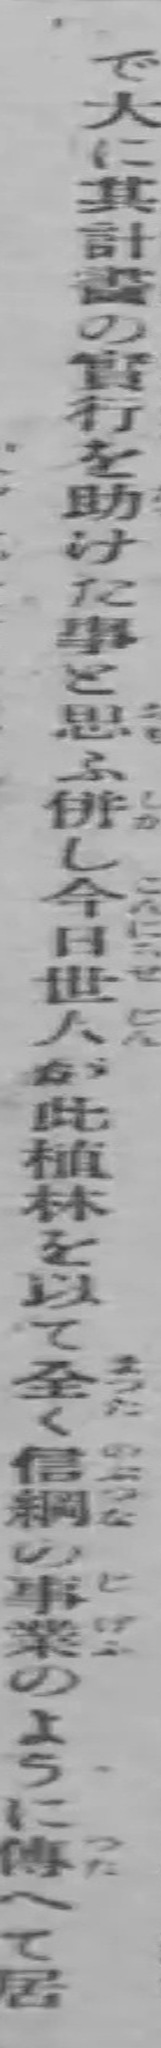で大に其計画の実行を助けた事と思ふ併し今日世人が此植林を以て全く信綱の事業のように伝へて居
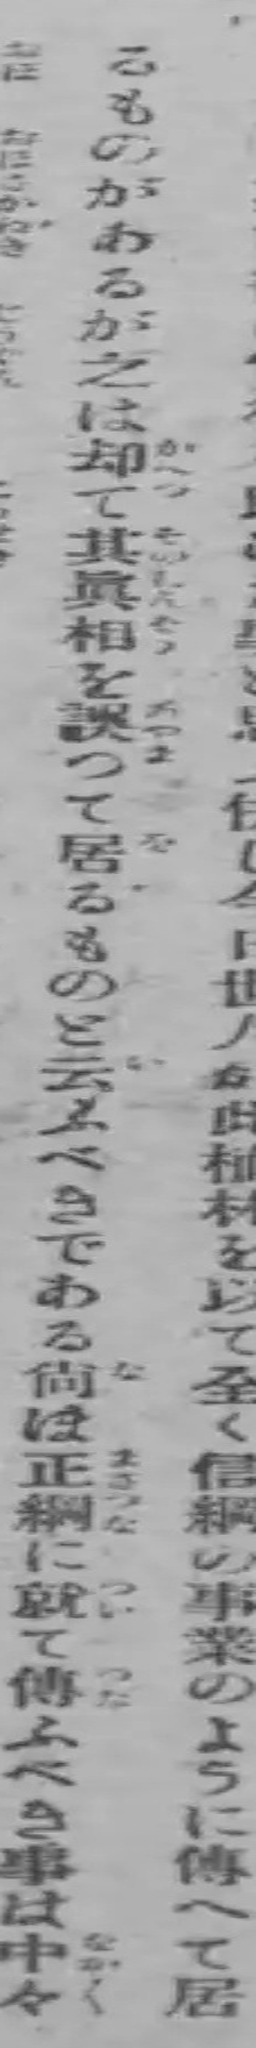るものがあるが之は却て其真相を誤つて居るものと云ふべきである尚ほ正綱に就て伝ふべき事は中々
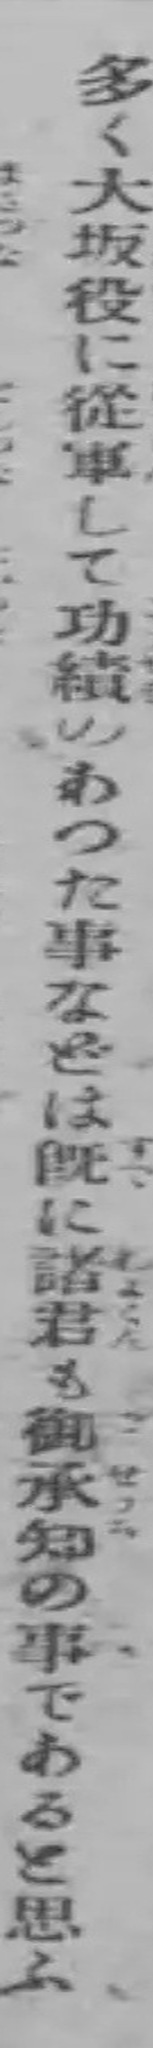多く大坂役に従軍して功績のあつた事などは既に諸君も御承知の事であると思ふ
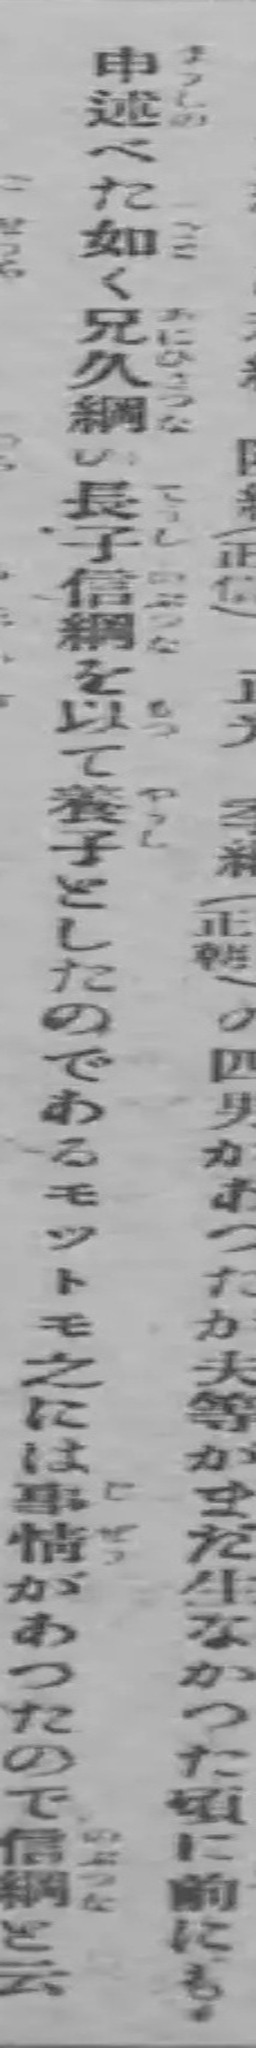申述べた如く兄久綱の長子信綱を以て養子としたのであるモツトモ之には事情があつたので信綱と云
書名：豊橋市史談
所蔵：国立国会図書館 National Diet Library, JAPAN
